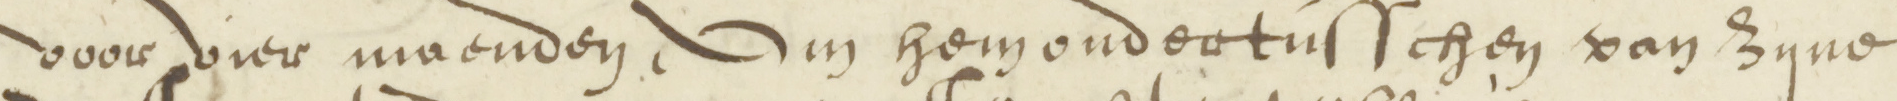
voor vier maenden om hem ondertusschen van zyne
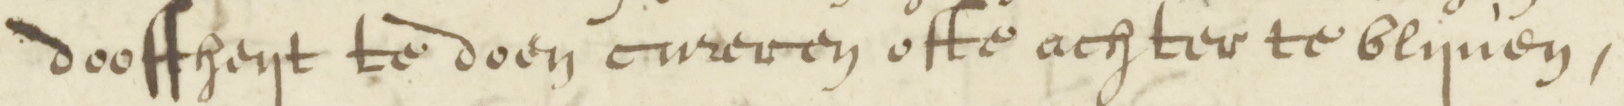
dooffheyt te doen cureren ofte achter te blyuen.
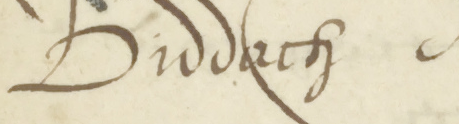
Biddach.
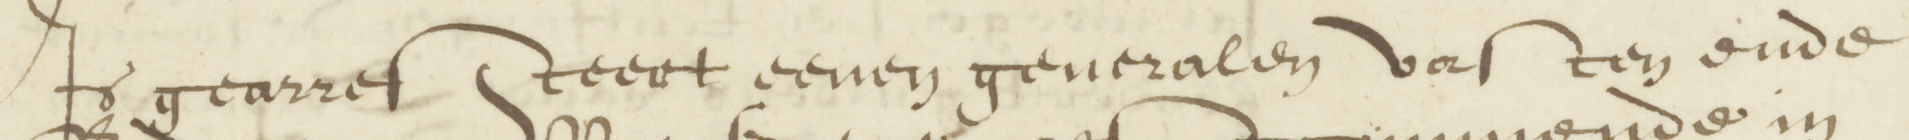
Is gearresteert eenen generalen vasten ende
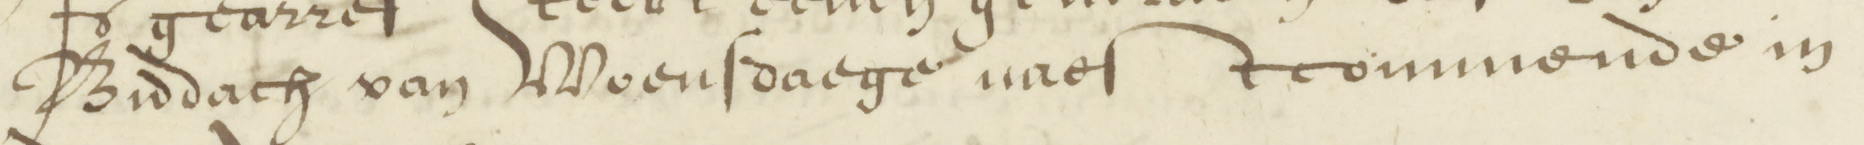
Biddach van Woensdaege naestcommende in
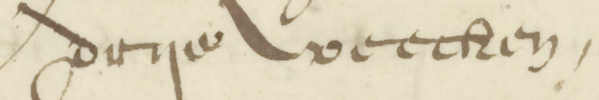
drye weecken.
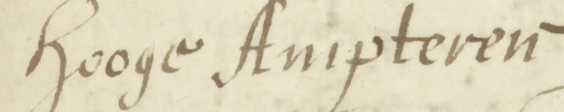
Hooge Ampteren
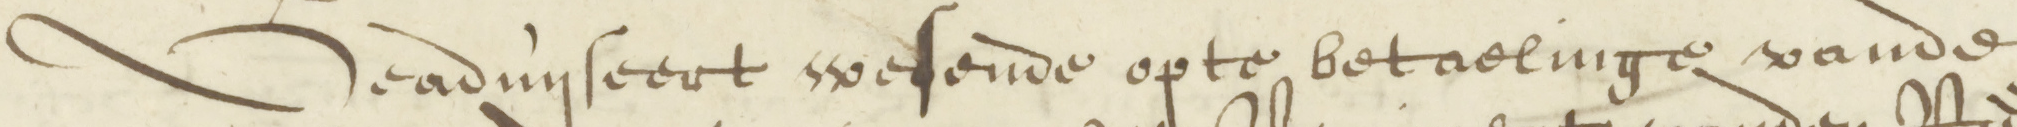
Geaduyseert wesende opte betaelinge vande
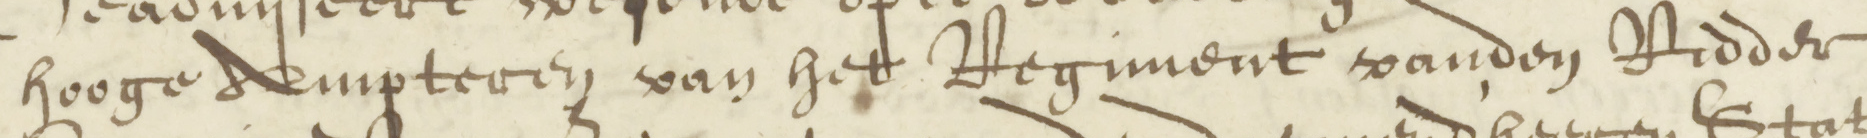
hooge Ampteren van het Regiment vanden Ridder
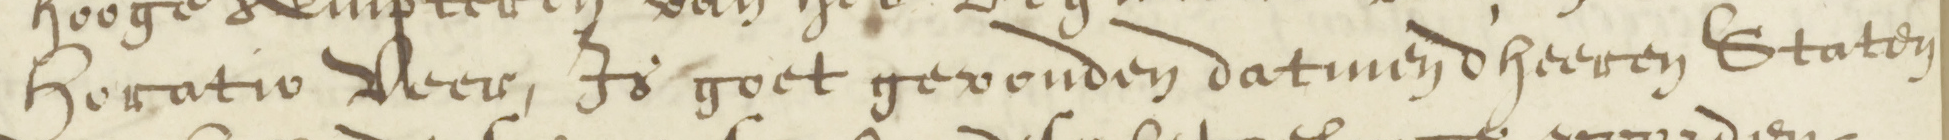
Horatio Veer, Is goet gevonden datmen d'heeren Staten
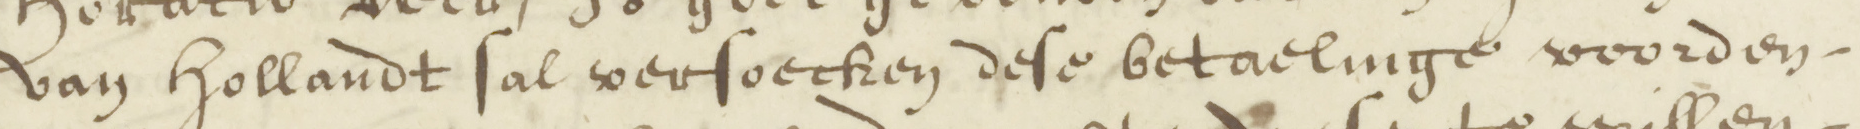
van Hollandt sal versoecken dese betaelinge voorden
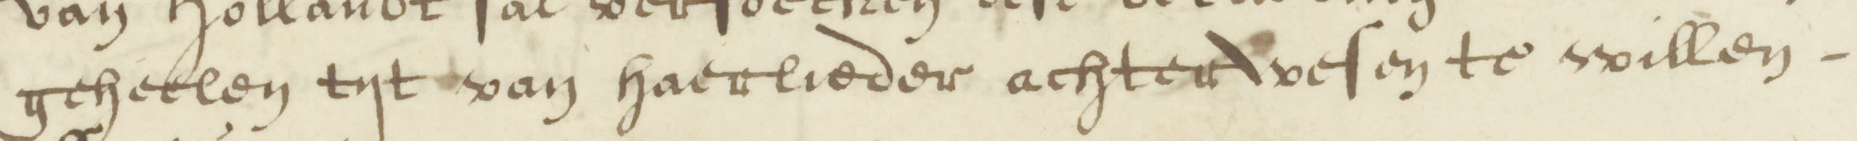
geheelen tyt van haerlieder achterwesen te willen
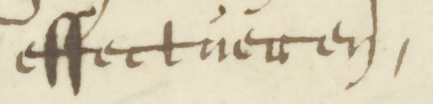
effectueren.
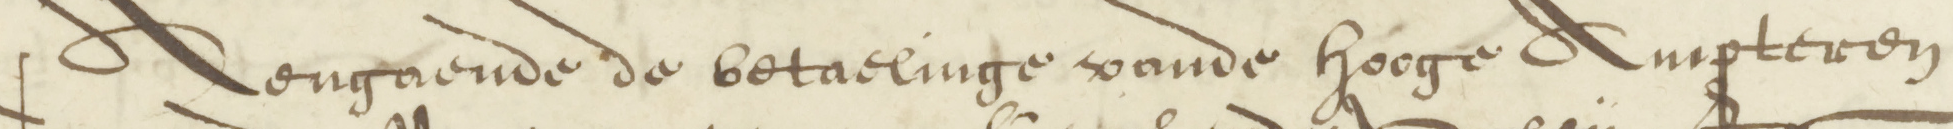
Aengaende de betaelinge vande hooge Ampteren
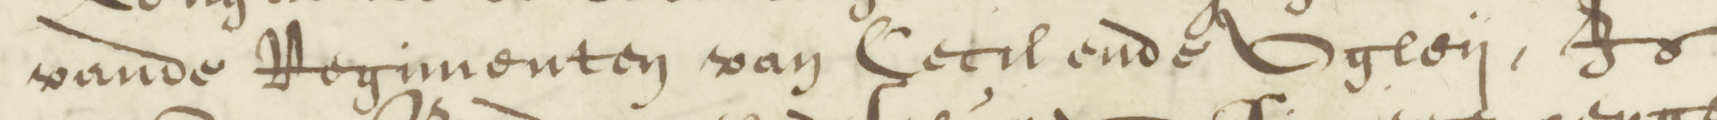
vande Regimenten van Cecil ende Ogleij, Is
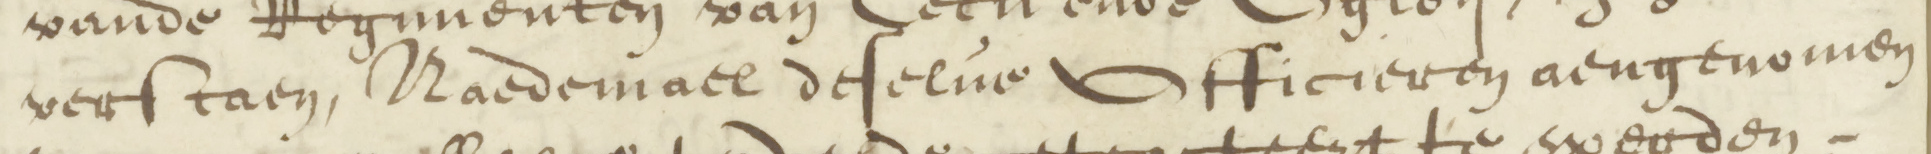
verstaen, Naedemael deselue Officieren aengenomen
